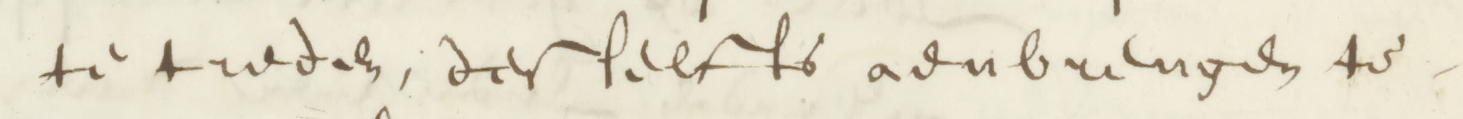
te treden, desselffs aenbrengen te
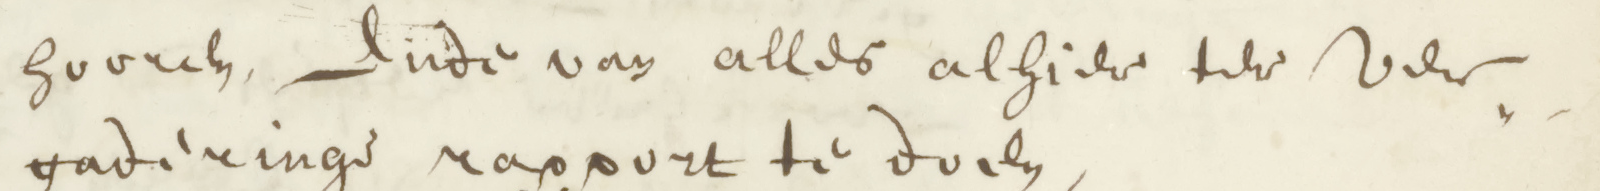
hooren, Ende van alles alhier ter ver,,
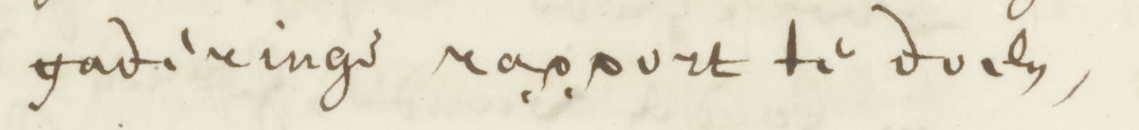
gaderinge rapport te doen.
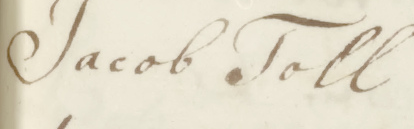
Jacob Toll
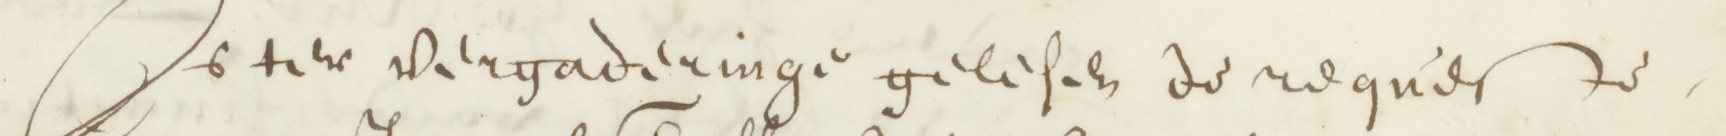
Is ter Vergaderinge gelesen de requeste
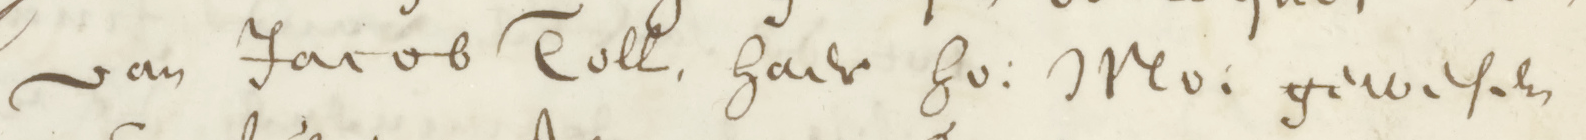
van Jacob Toll, haer ho:Mo: gewesen
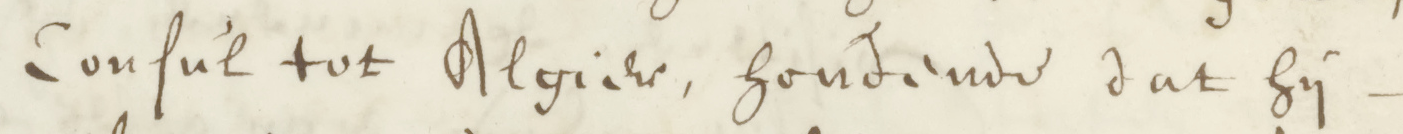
Consul tot Algier, houdende dat hij -
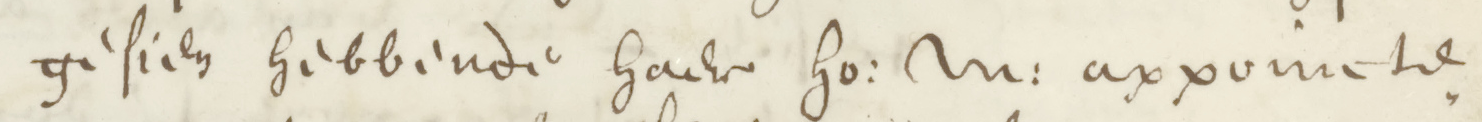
gesien hebbende haer ho:M: appoincte„
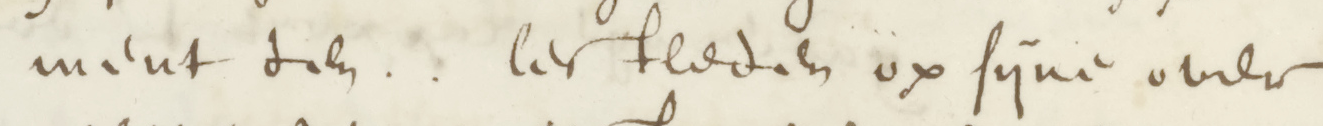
ment den.. lestleden op sijne over
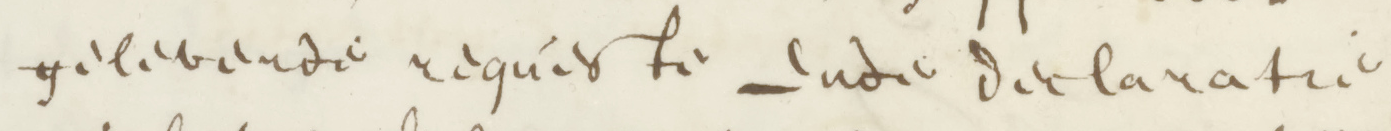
geleverde requeste Ende declaratie
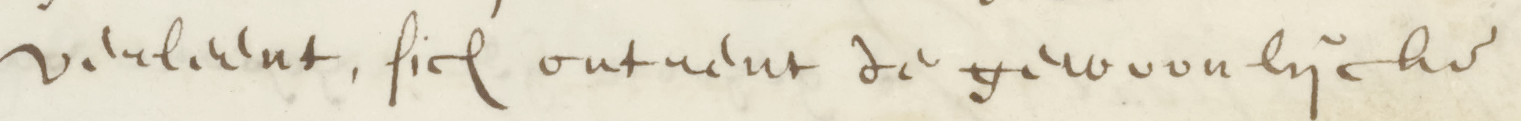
verleent, sich ontrent de gewoonlijcke
